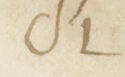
82
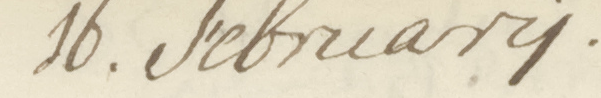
16. Februarij.
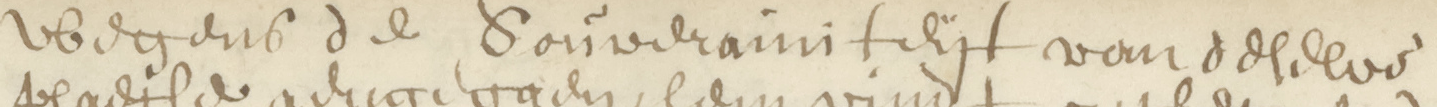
wegens de Souverainiteijt van deselve
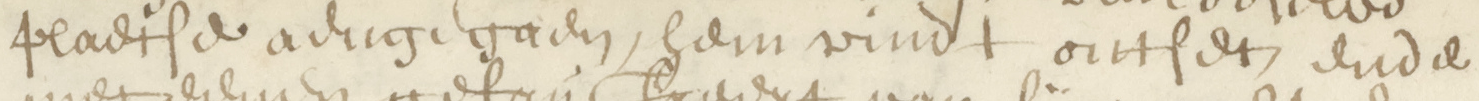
plaetse aengegaen, hem vindt ontset, ende
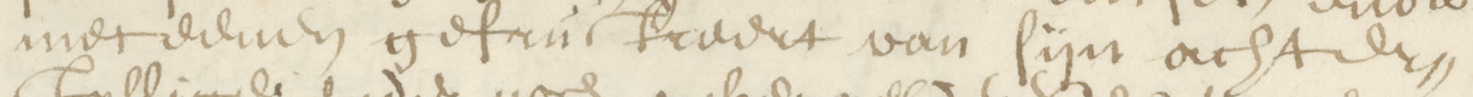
met eenen gefrustreert van sijn achter„
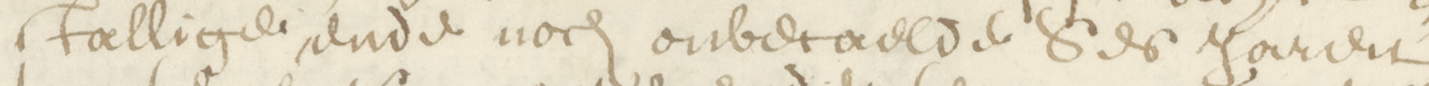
stallige, ende noch onbetaelde Ses Jaren
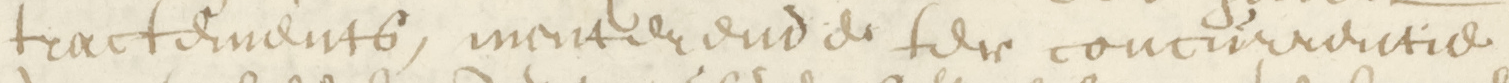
tractements, monterende ter concurrentie
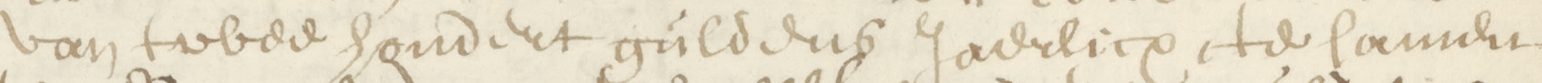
van twee hondert guldens Jaerlicx, te samen
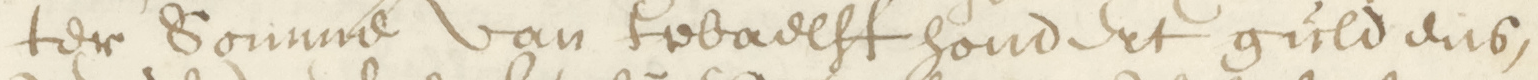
ter somme van twaelff hondert guldens,
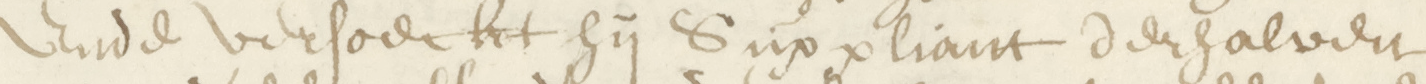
Ende versoeckt hij Suppliant derhalven
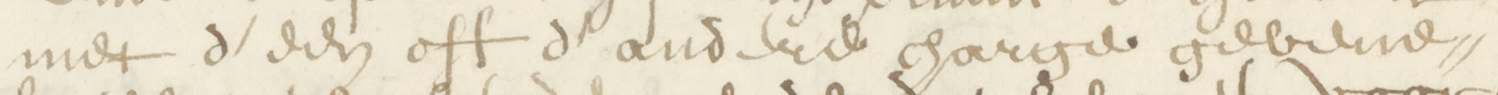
met d‛een off d‛andere charge gebene„
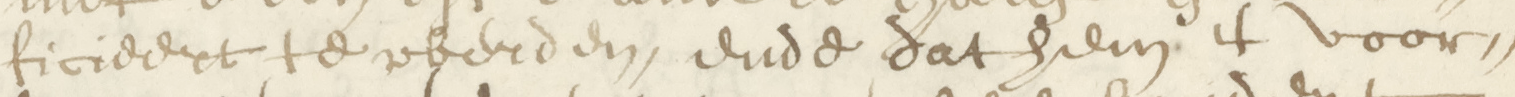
ficieert te werden, ende dat hem ‛t voor„
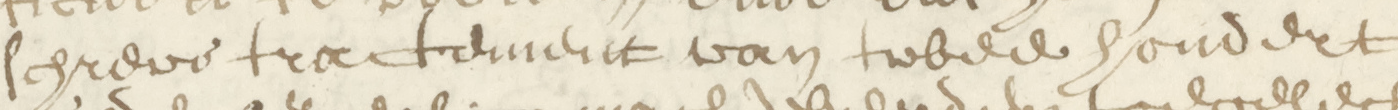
schreve tractement van twee hondert
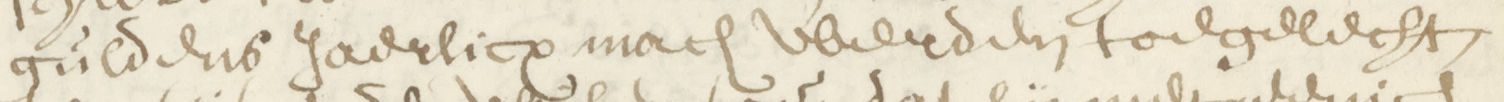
guldens Jaerlicx mach werden toegelecht,
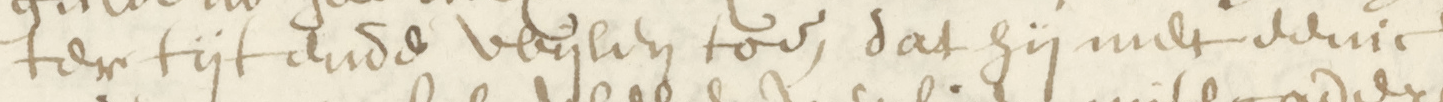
ter tijt ende wijlen toe, dat hij met eenich
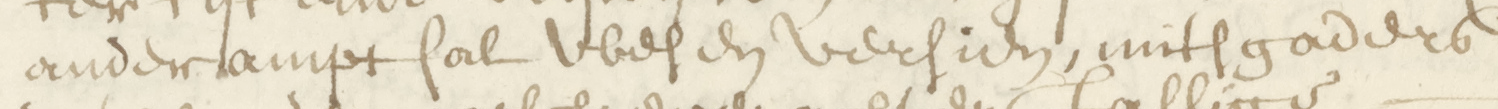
ander ampt sal wesen versien, mitsgaders
